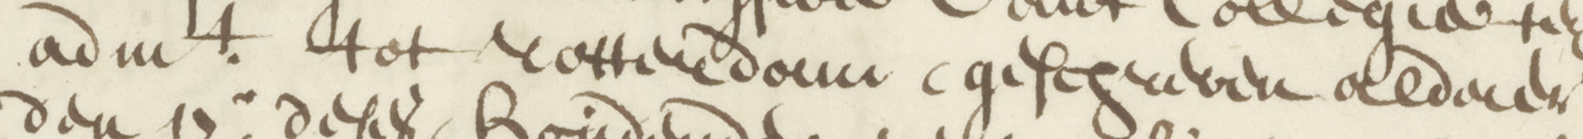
admt. tot Rotterdam, geschreven aldaer
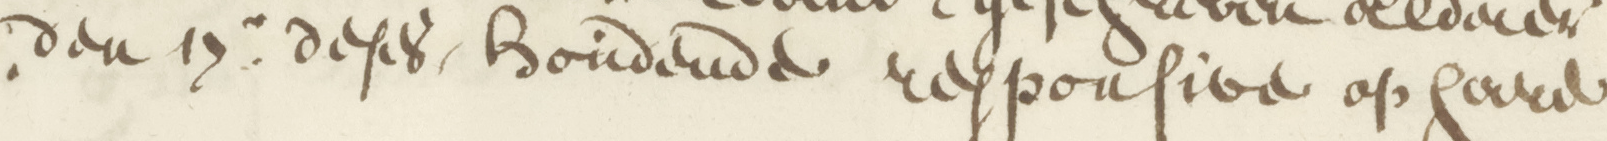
den 17e. deses, houdende responsive op hare
